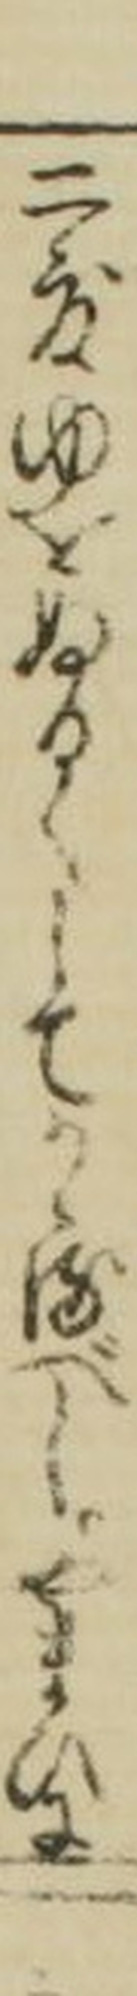二度ゆをぬるくしてかゝるべし。やまひに
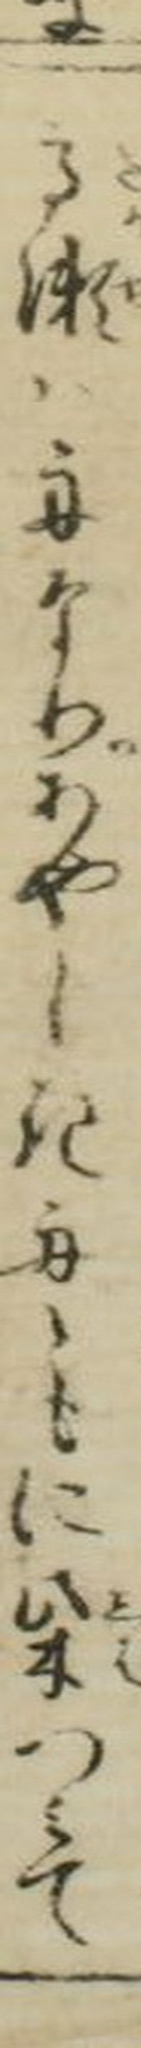高瀬は舟なり。あやしき舟ともに柴つみて
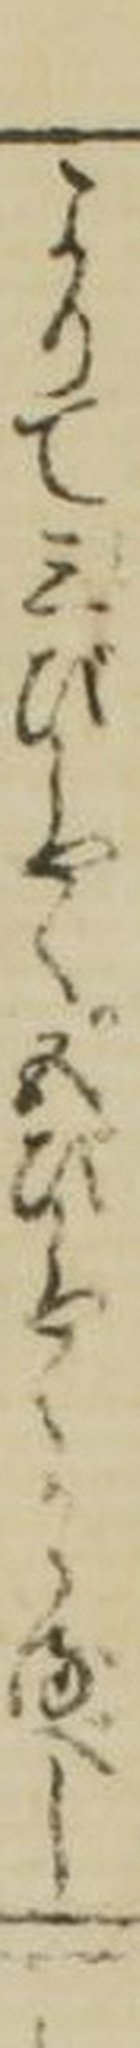よりて三びしやく。五びしやくかゝるべし
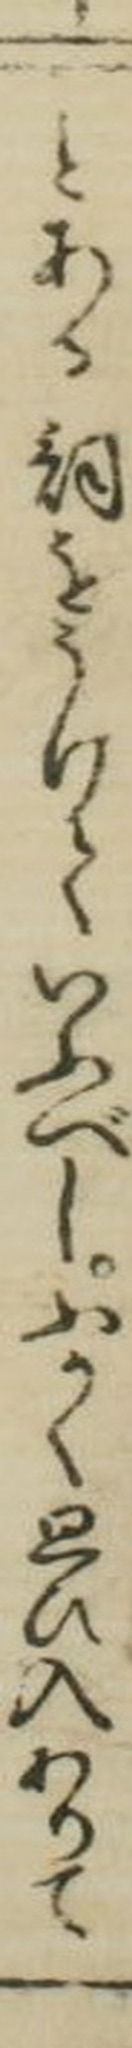とある詞をうけていふべし。ふかく思ひ入ありて
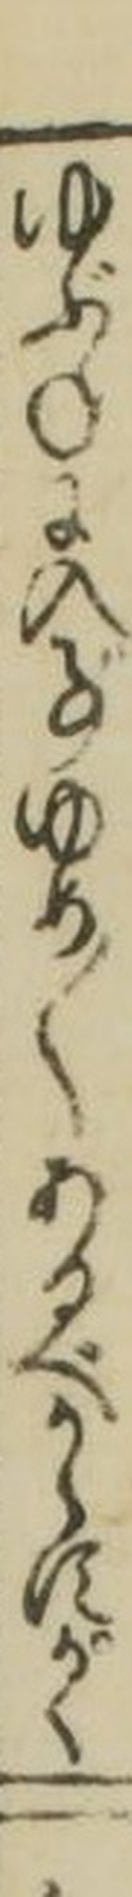ゆぶねに入る事ゆめ〳〵あるべからず。かく
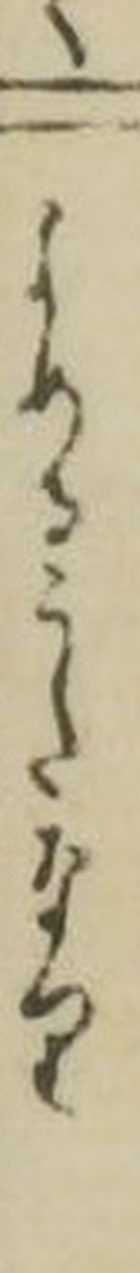よめるうたなり
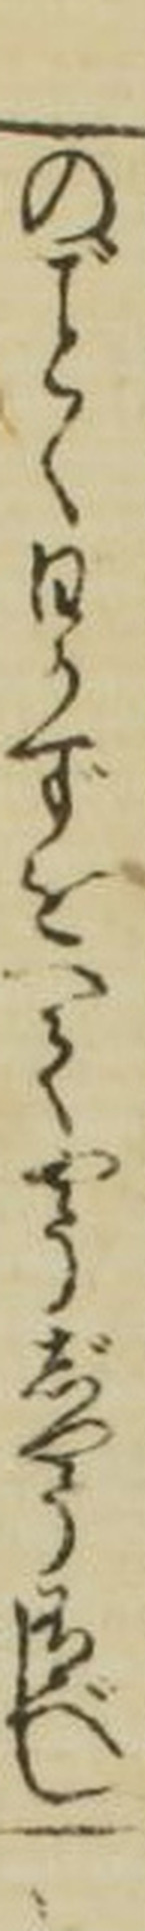のごとく日かずをへてやうじやう有べし
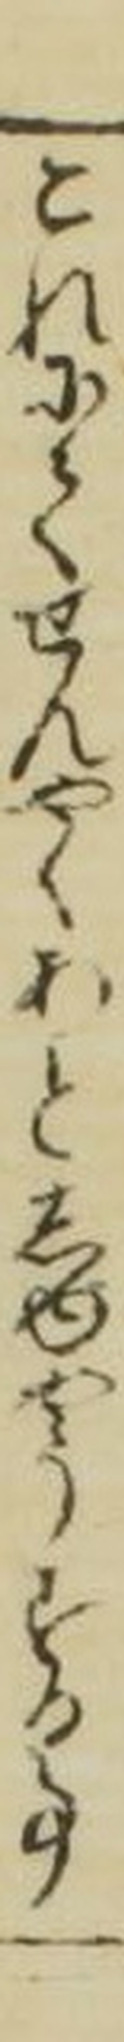これにてせんやくあとしゆやうする事
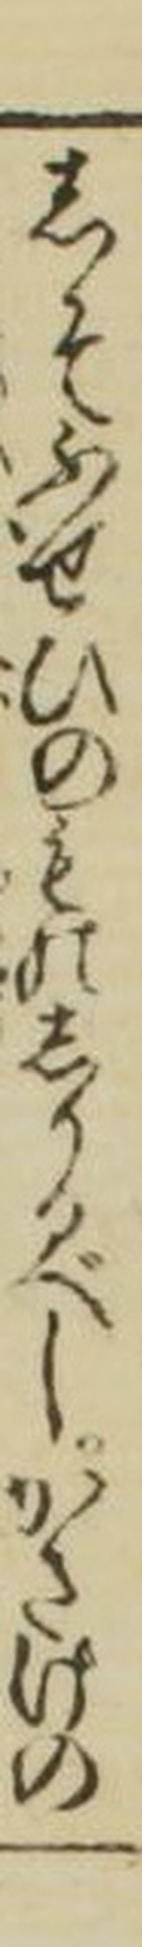しかてふせいのものしかるべし。かさけの
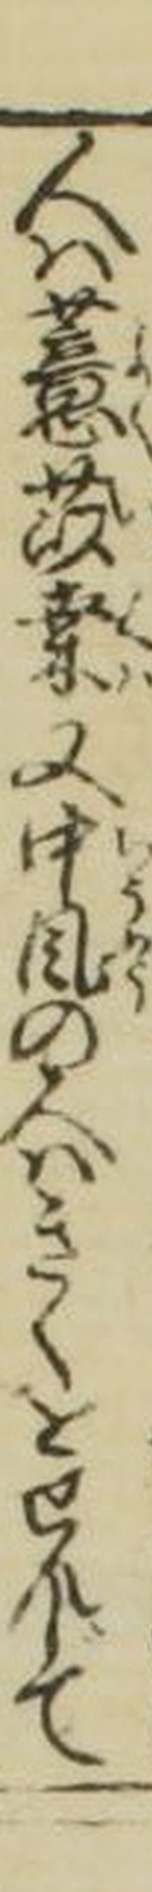人は薏苡桑又中風の人はきくをせんじて
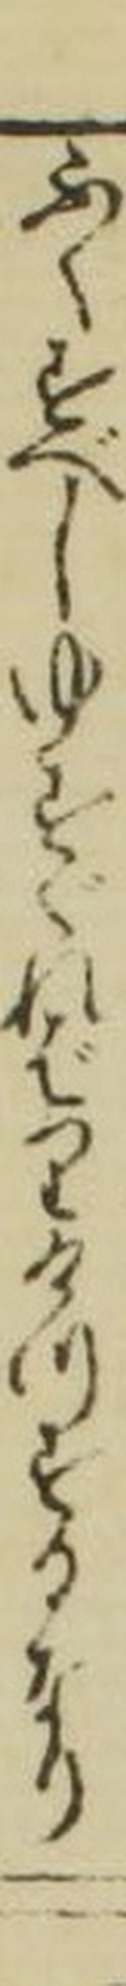ふくすべしゆすぐればりけつするなり
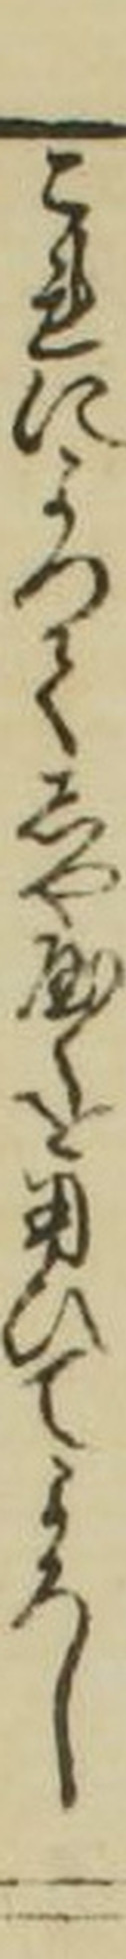これによつてしややくを用ひてよろし
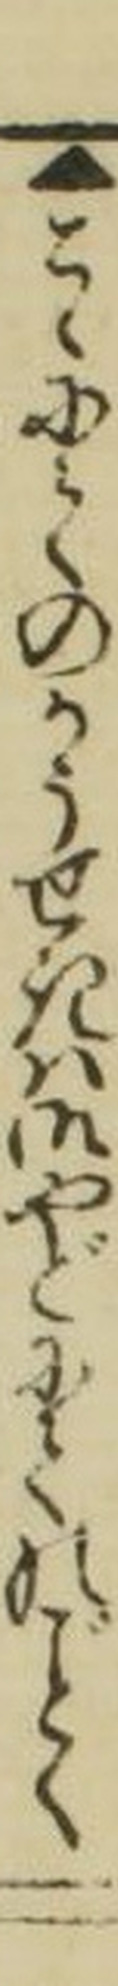▲こゝにてのかうせきは御やどにてのごとく
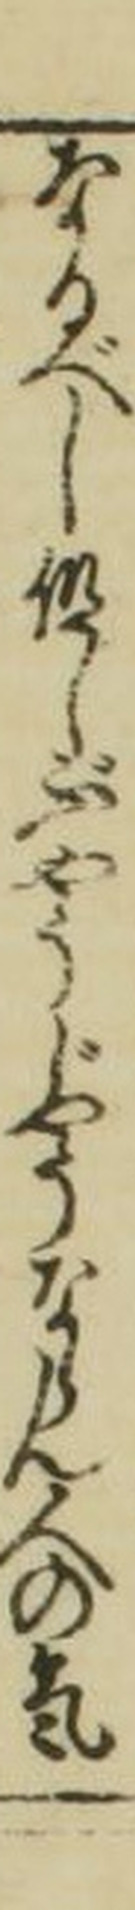なるべし但しぶやうじやうならん人の気
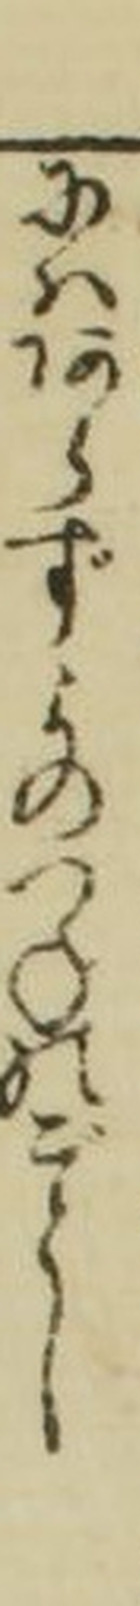にはあらずよのつねのごとし
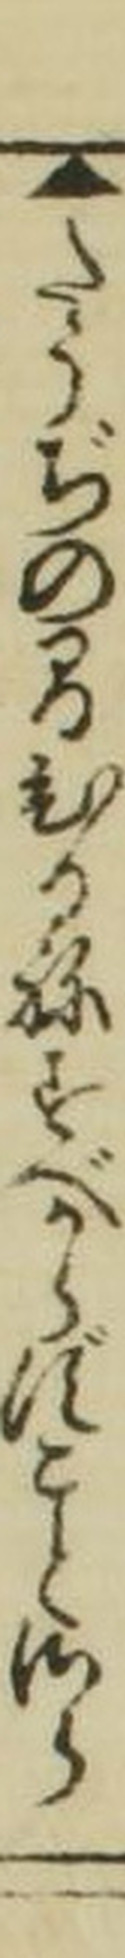▲たうぢの間ひるねすべからずことさら
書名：女源氏教訓鑑
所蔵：東京学芸大学附属図書館
